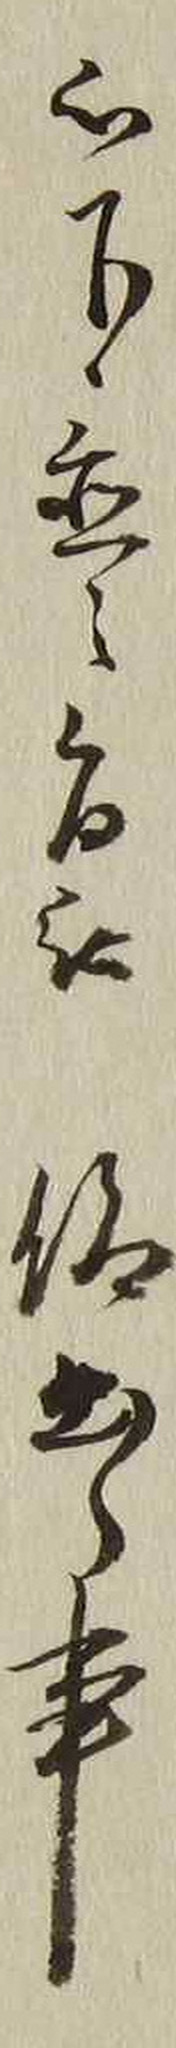被下置候旨被仰出候事
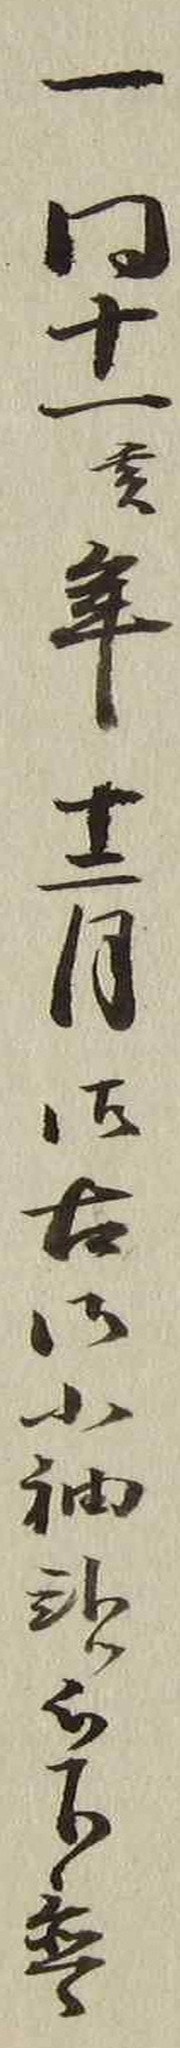一同十一亥年十二月御古御小袖弐ツ被下置候
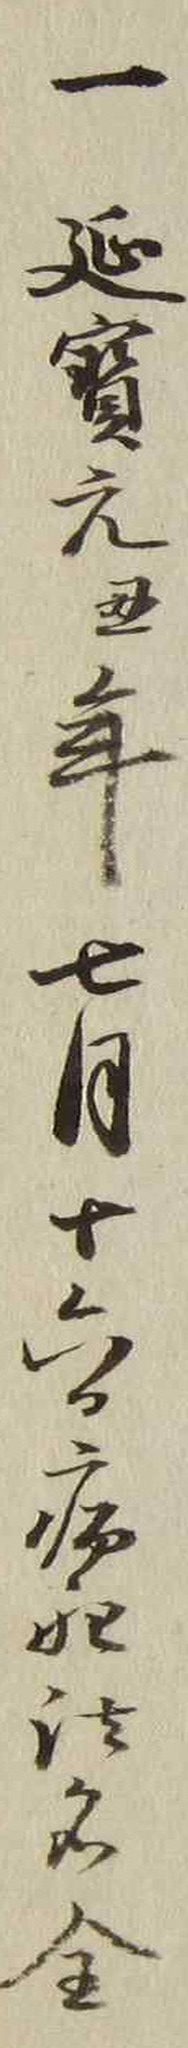一延宝元丑年七月十六日病死法名全
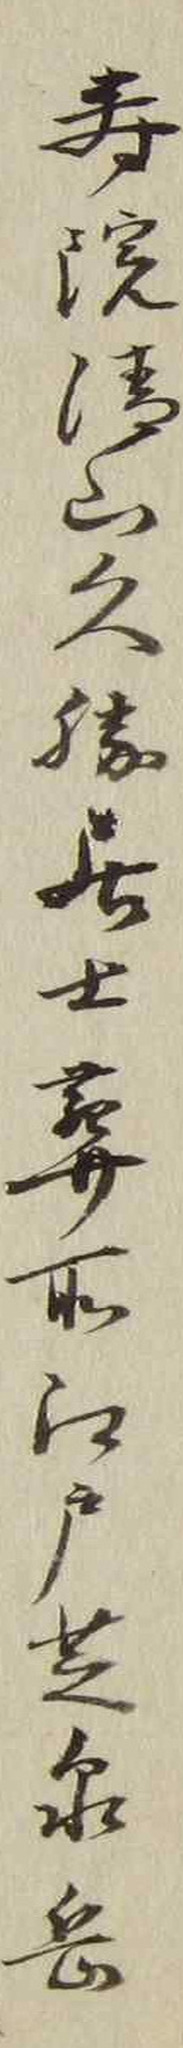寿院清山久勝居士葬所江戸芝泉岳

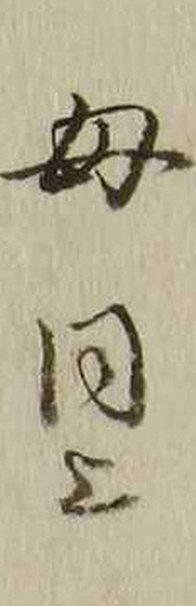母同上
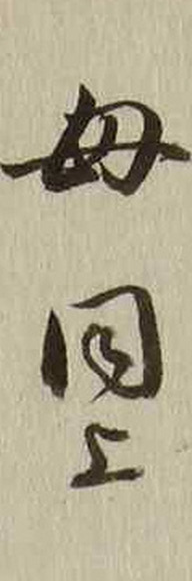母同上
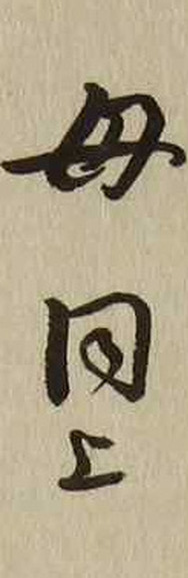母同上
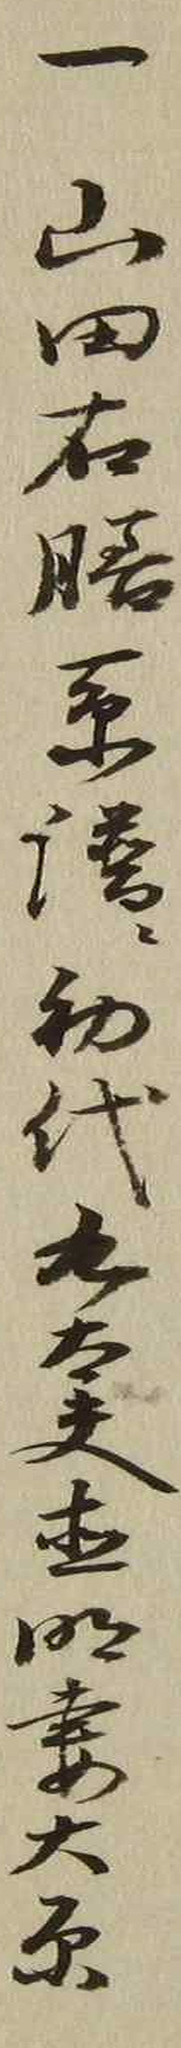一山田右膳系譜ニ初代九太夫直明妻大原
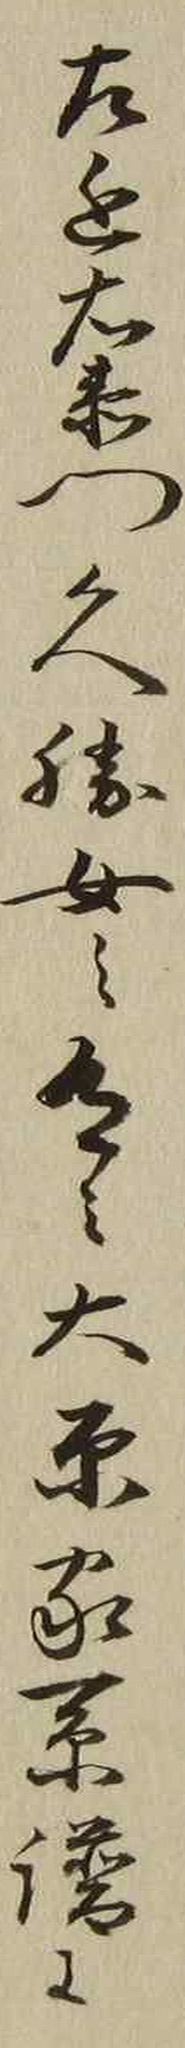左近右衛門久勝女之有之大原家系譜ニ
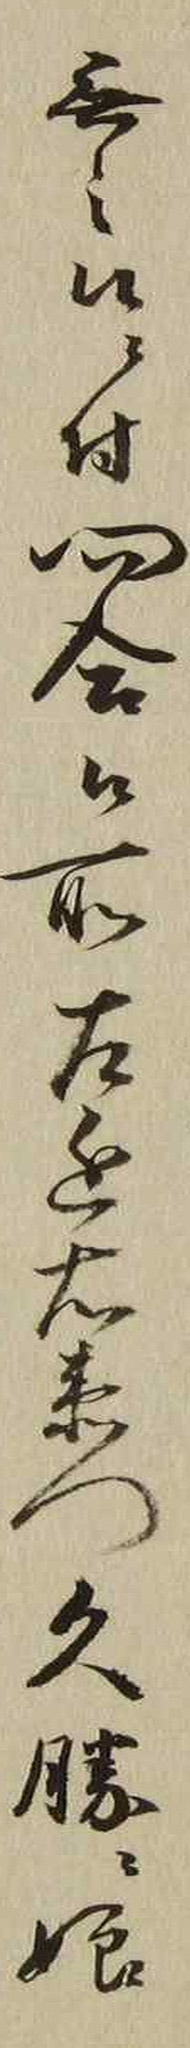無之候ニ付問合候所左近右衛門久勝ニ娘
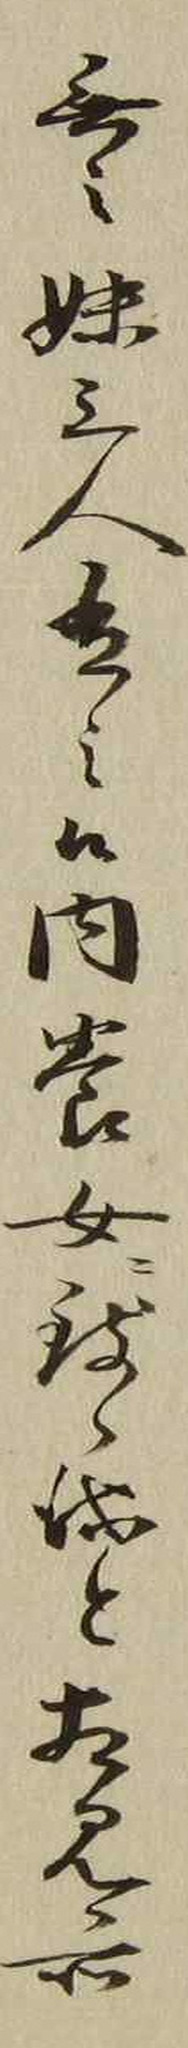無之妹三人有之候内養女ニ致候儀と相見候所
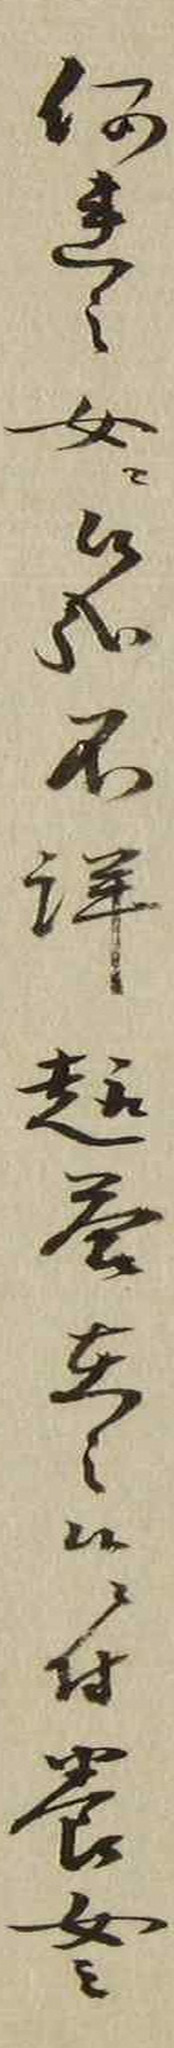何れ之女ニ候哉不詳趣答在之候ニ付養女与
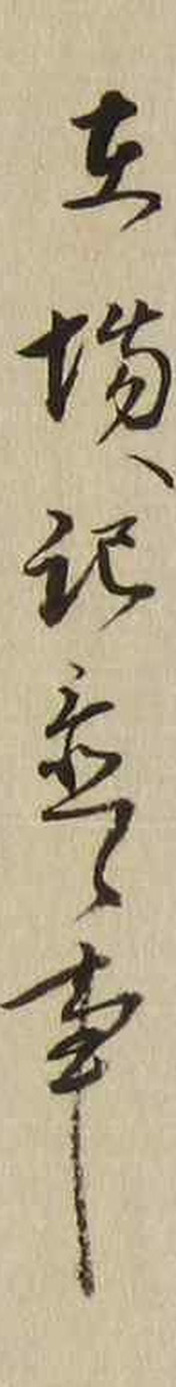在場へ記置候事
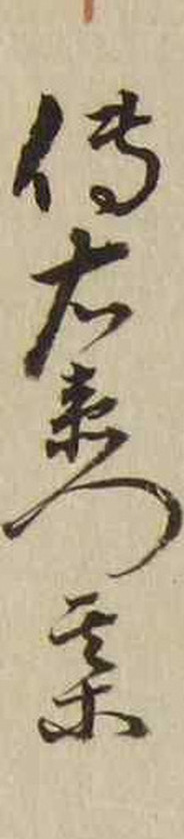伝右衛門某

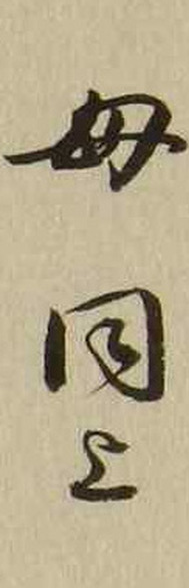母同上
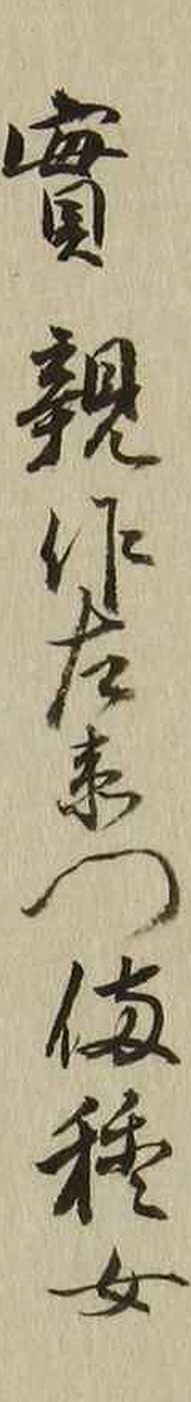実親作左衛門備種女
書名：諸士系譜　巻之69　を之部3
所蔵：会津若松市立会津図書館
